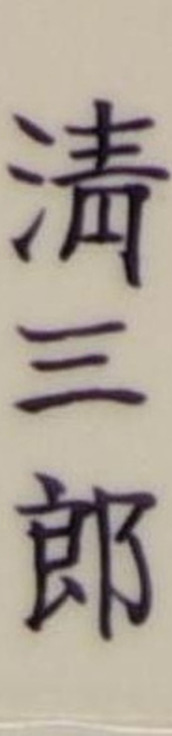清三郎
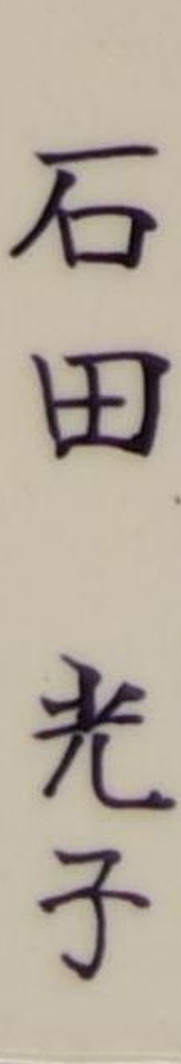石田光子

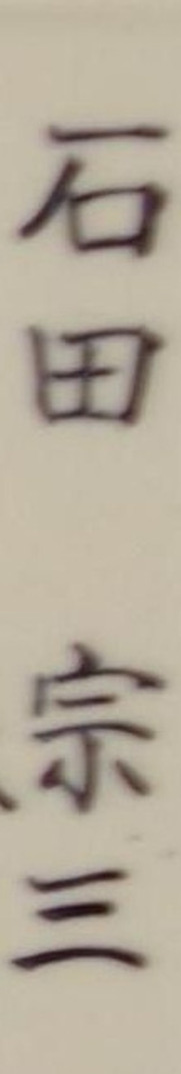石田宗三
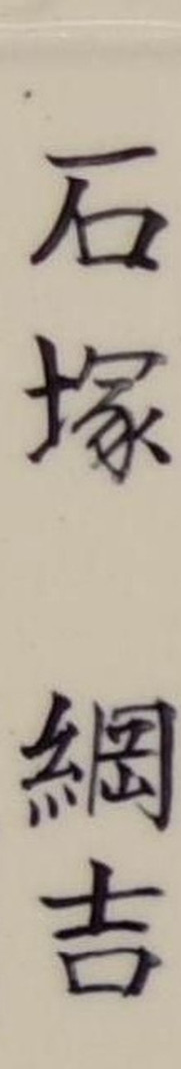石塚綱吉

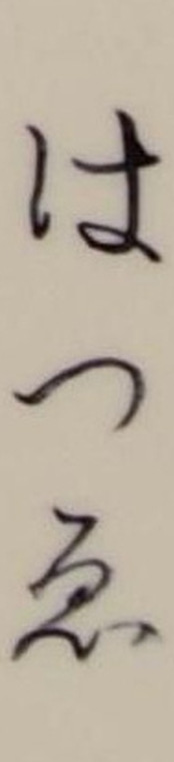はつえ
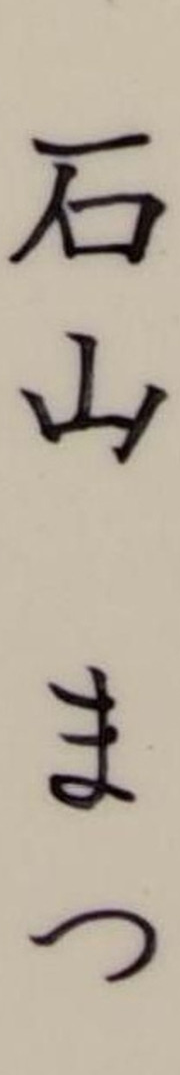石山まつ
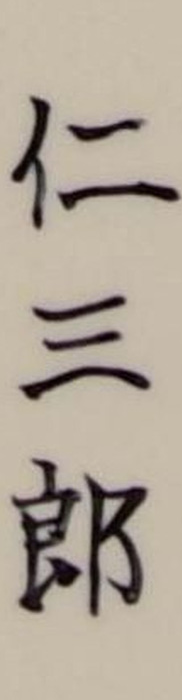仁三郎
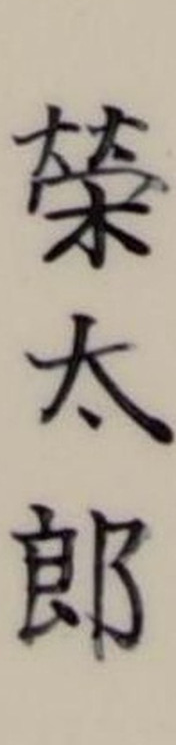榮太郎
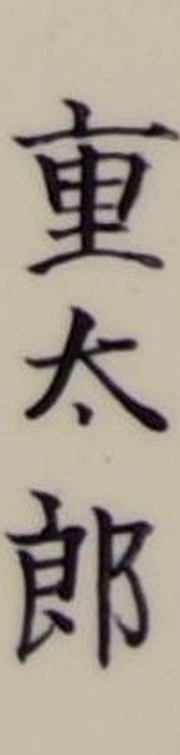重太郎

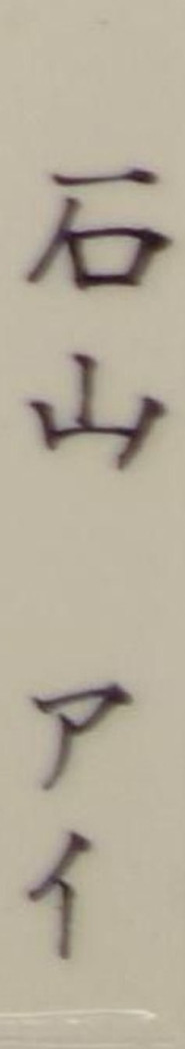石山アイ
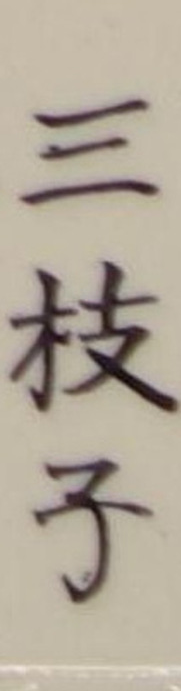三枝子
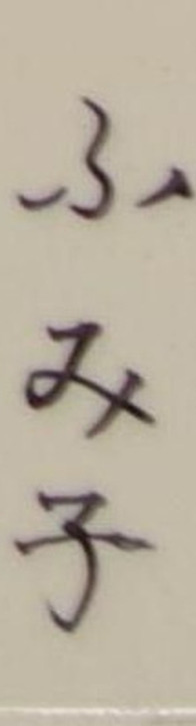ふみ子
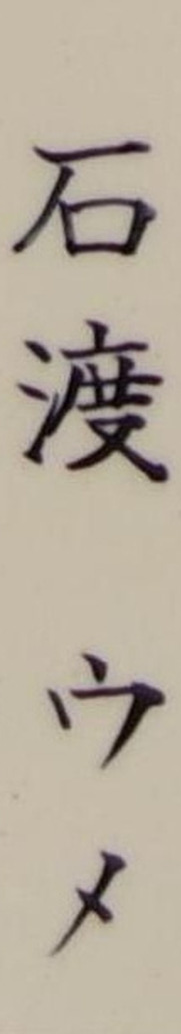石渡ウメ
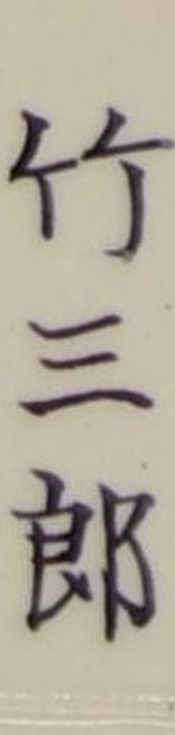竹三郎
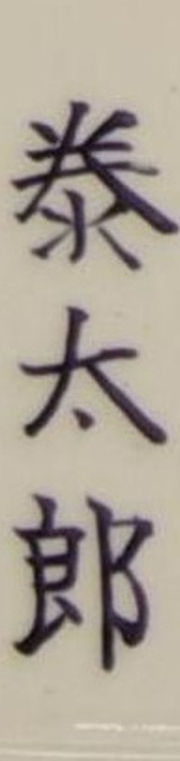泰太郎

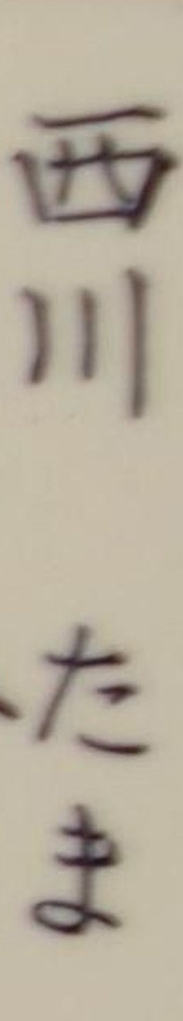西川たま
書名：M~S
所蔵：高野山金剛峯寺
